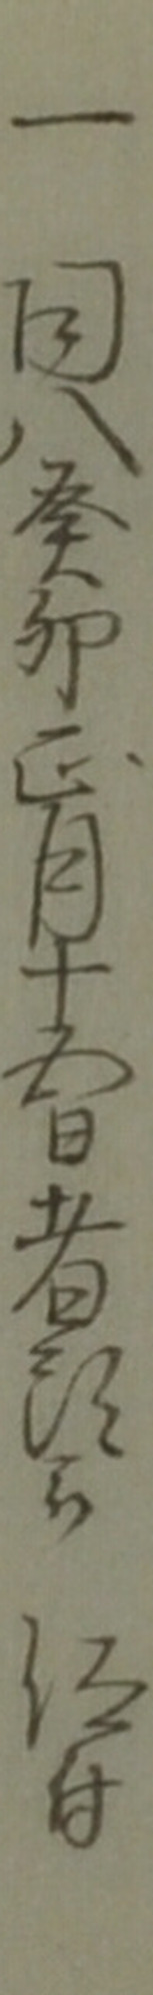一同八癸卯正月十五日者頭被仰付
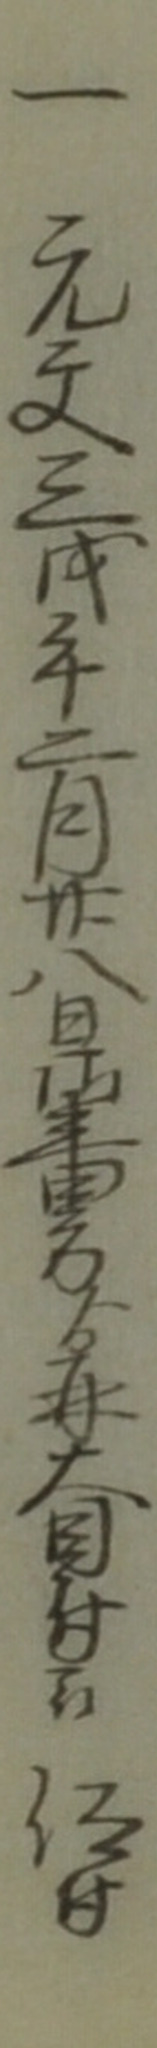一元文三戊午二月廿八日御番方ゟ再大目付被仰付
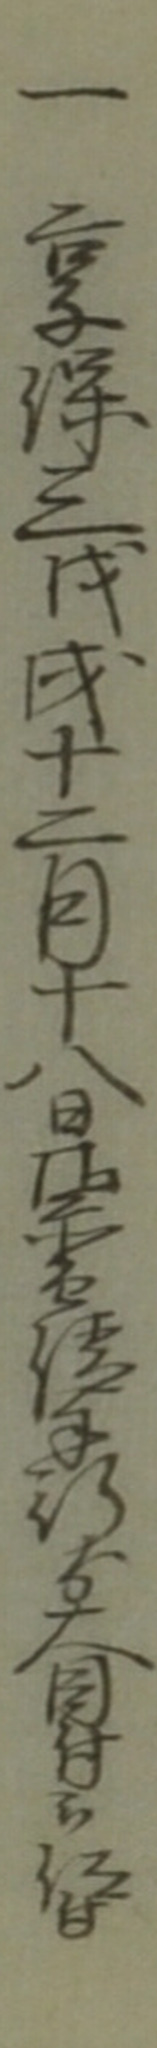一享保三戊戌十二月十八日御普請奉行ゟ大目付被仰付
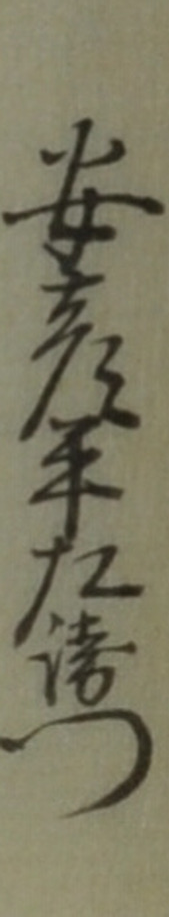安彦平左衛門
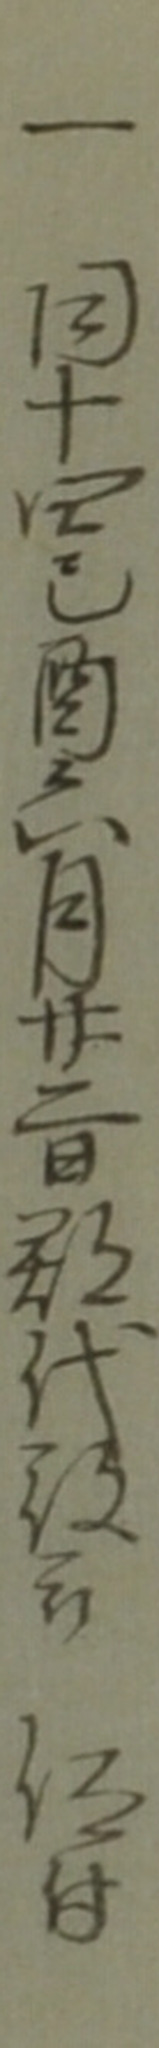一同十四己酉六月廿二日郡代役被仰付
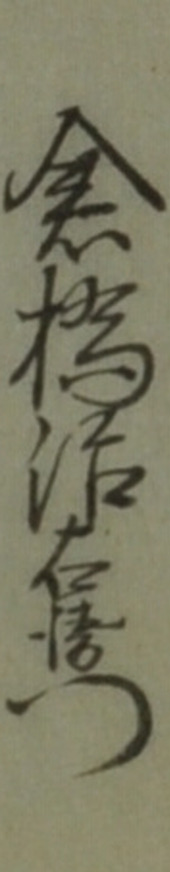倉橋治右衛門
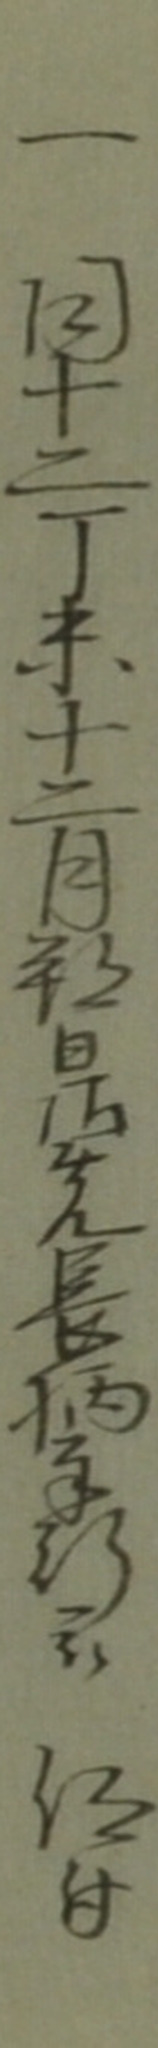一同十二丁未十二月朔日御先長柄奉行被仰付
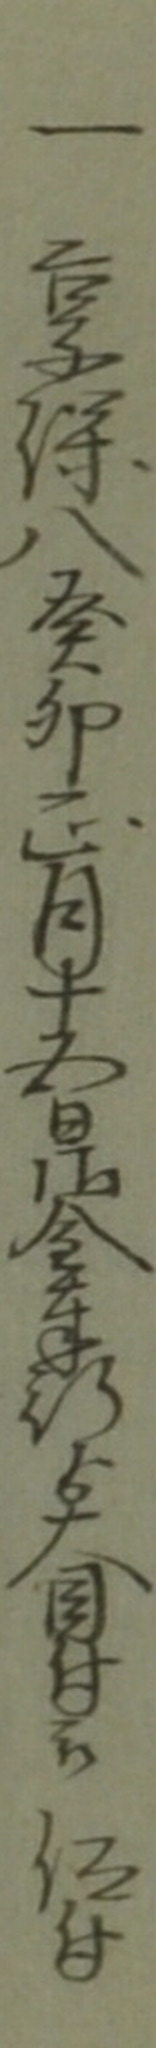一享保八癸卯正月十五日御金奉行ゟ大目付被仰付
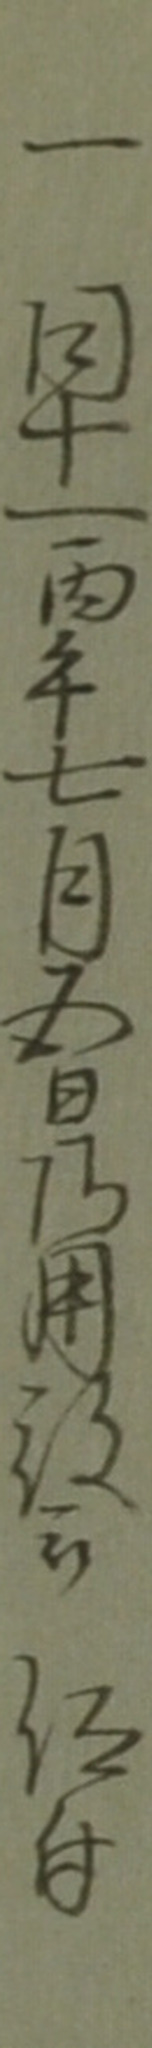一同十一丙午七月五日御用役被仰付
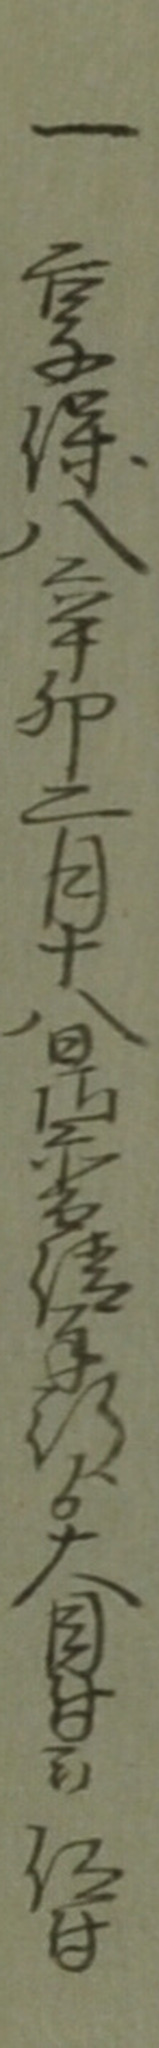一享保八辛卯二月十八日御普請奉行ゟ大目付被仰付
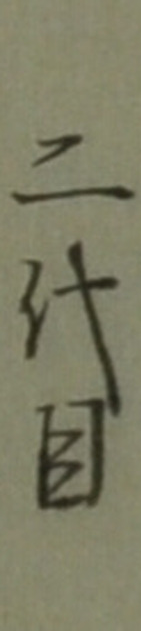二代目
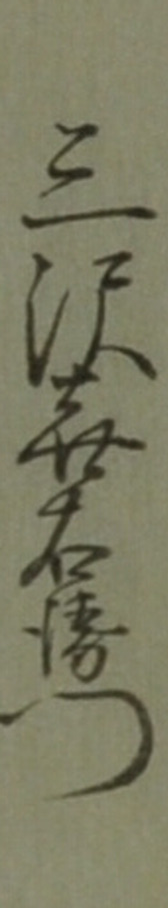三沢喜右衛門
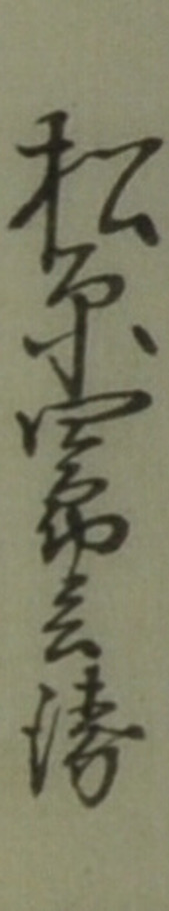松原四郎兵衛
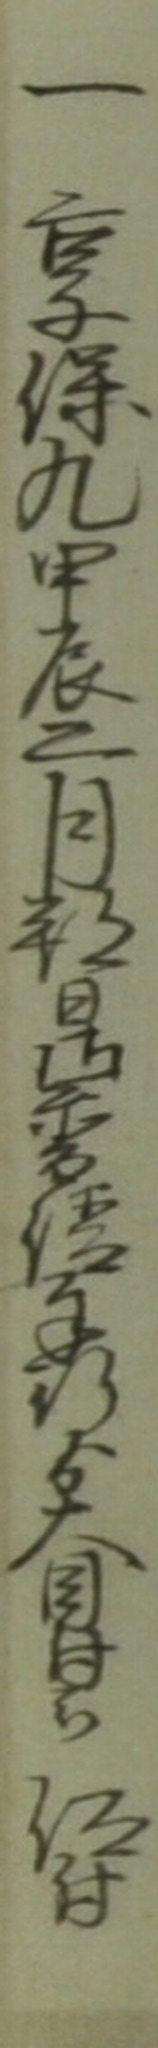一享保九甲辰二月朔日御普請奉行ゟ大目付被仰付

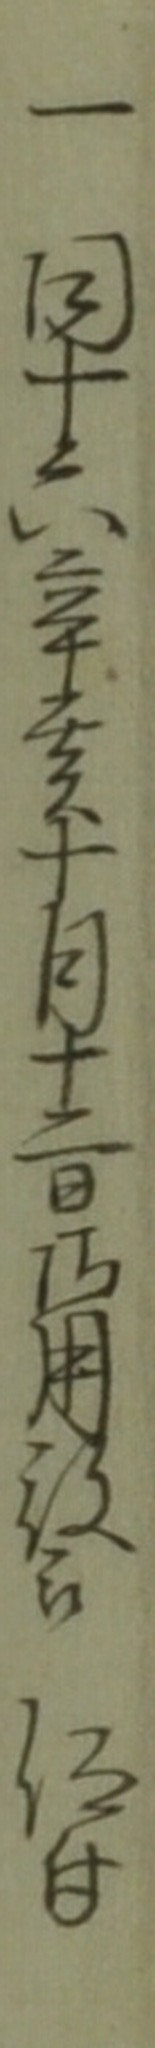一同十六辛亥十月十二日御用役被仰付
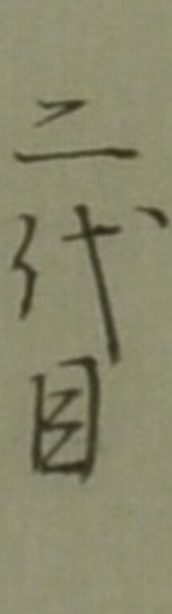二代目
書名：諸御役代々録（三）
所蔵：伊那市立高遠町図書館・合同会社AMANE
